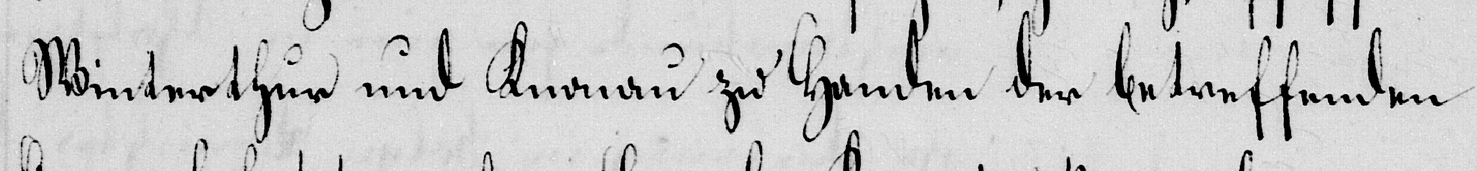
Winterthur und Knonau zu Handen der betreffenden
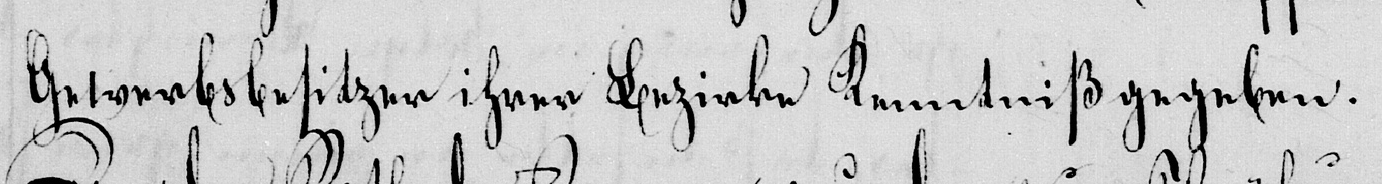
Gewerbsbesitzer ihrer Bezirke Kenntniß gegeben.
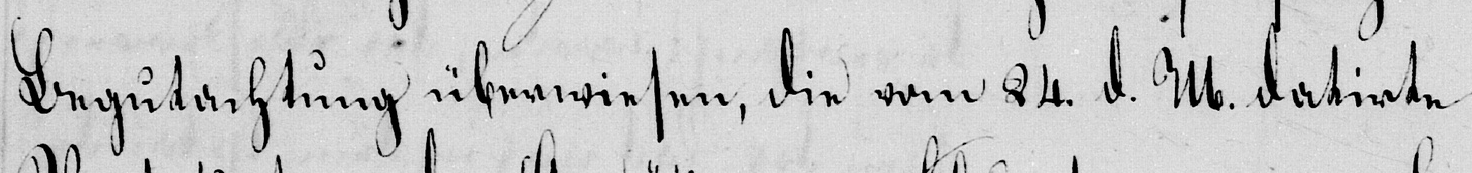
Begutachtung überwiesen, die vom 24. d. M. datirte
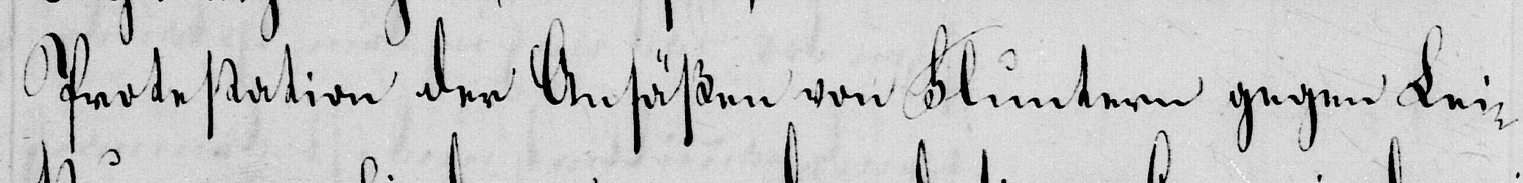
Protestation der Ansäßen von Fluntern gegen Lei¬
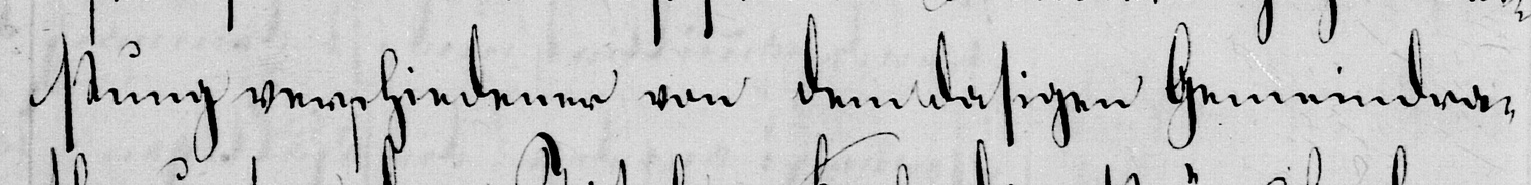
stung verschiedener von dem dasigen Gemeindra¬
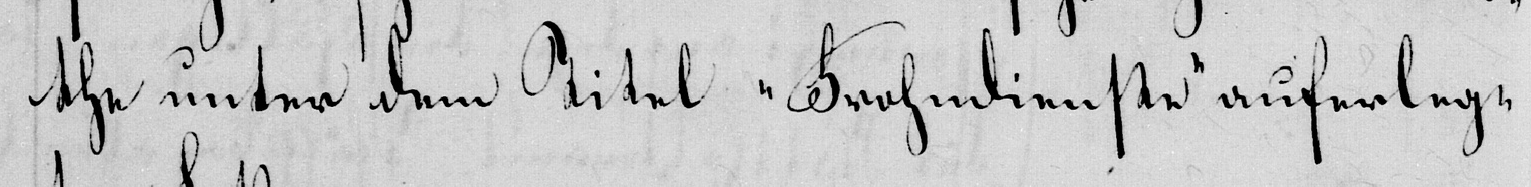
the unter dem Titel „Frohndienste“ auferleg¬
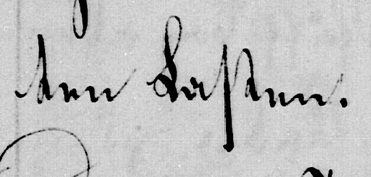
ten Lasten.
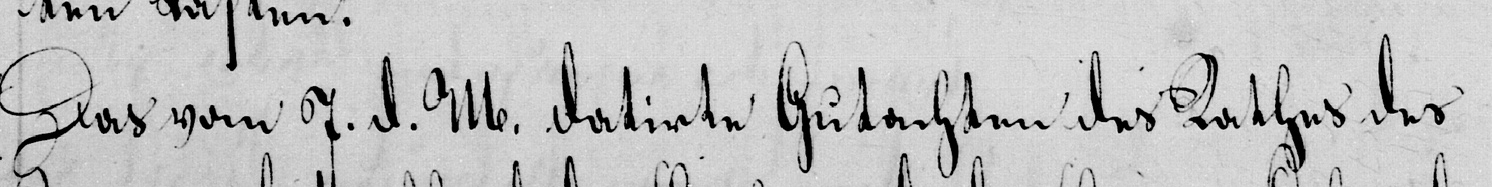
Das vom 7. d. M. datirte Gutachten des Rathes des
